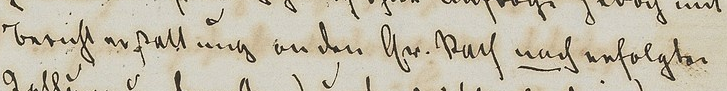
Berichterstattung an den Gr. Rath nach erfolgter
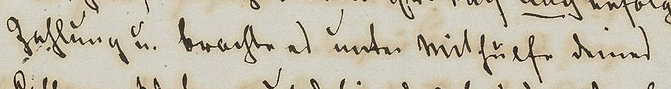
Zahlung u. brachte es unter Mithülfe deines
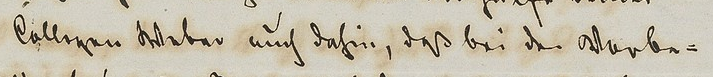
Collegen Weber auch dahin, daß bei der Vorbe-
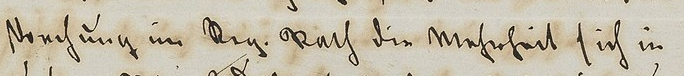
sprechung im Reg.Rath die Mehrheit sich in
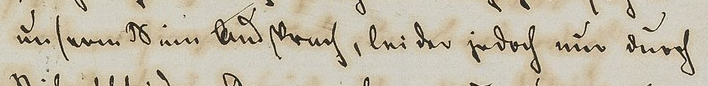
unserm Sinn aussprach, leider jedoch nur durch
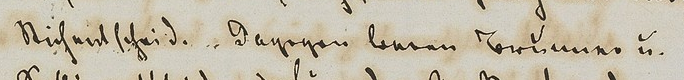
Stichentscheid. Dagegen waren Brunner u.
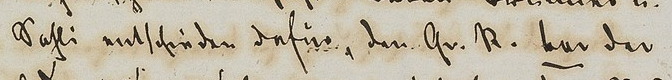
Sahli entschieden dafür, den Gr. R. vor der
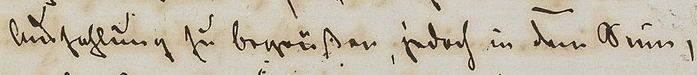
Auszahlung zu begrüßen, jedoch in dem Sinn,
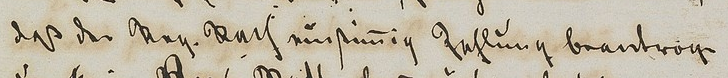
daß der Reg.Rath einstimmig Zahlung beantrage
